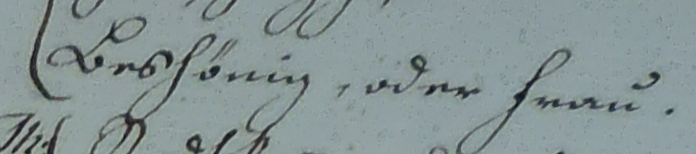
Bessönig, oder Frau.
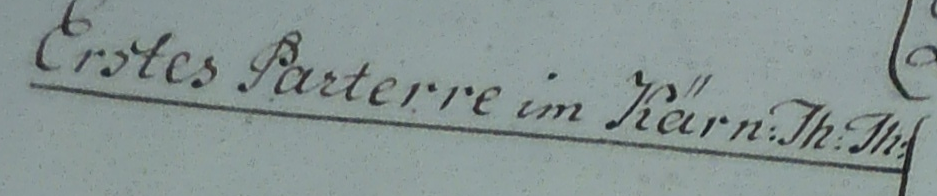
Erstes Parterre im Kärn:Th:Th:
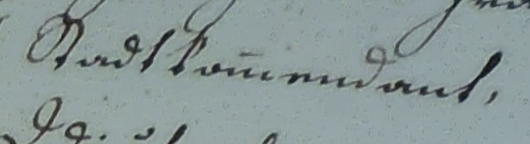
Stadtkom̅endant,
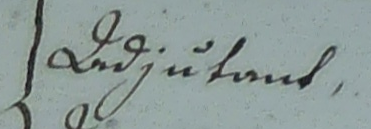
Adjutant,
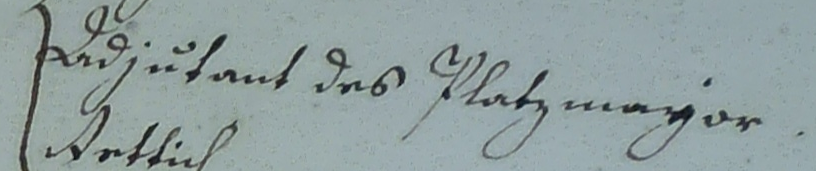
Adjutant des Platzmajor
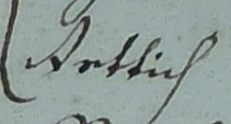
Rettich
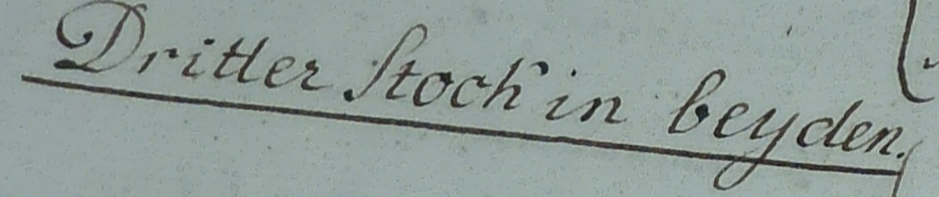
Dritter Stock in beyden.
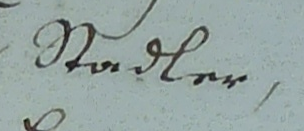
Stadler,
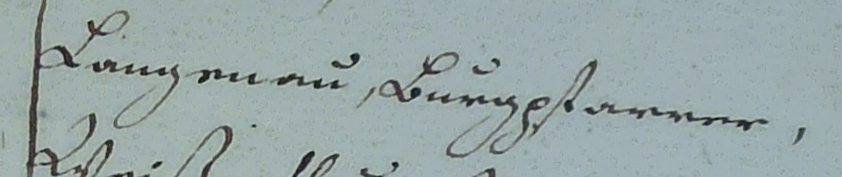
Langenau, Burgpfarrer,
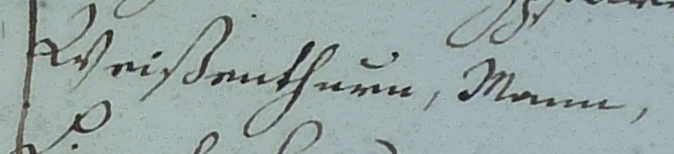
Weißenthurn, Mann,
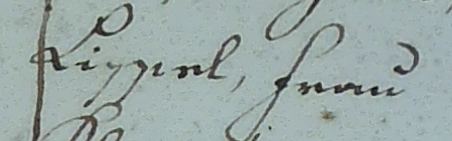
Lippel, Frau,
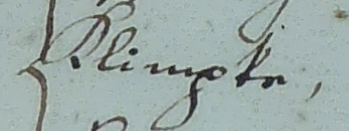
Klimpke,
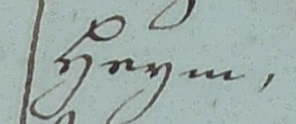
Heym,
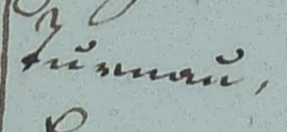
Turnau,
